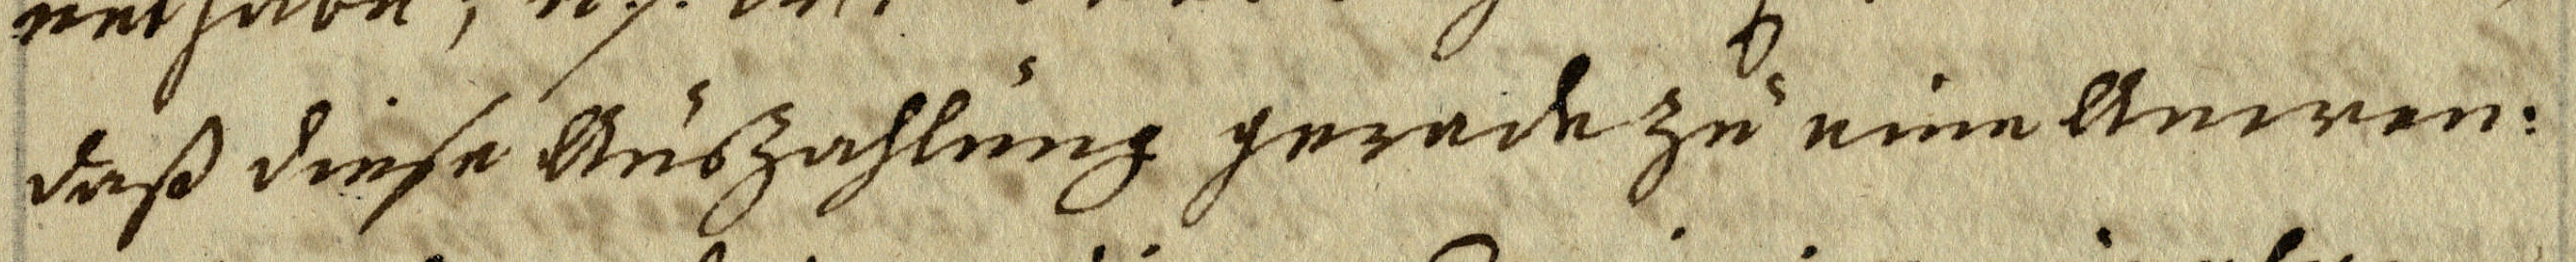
daß diese Auszahlung geradezu eine Anwen¬
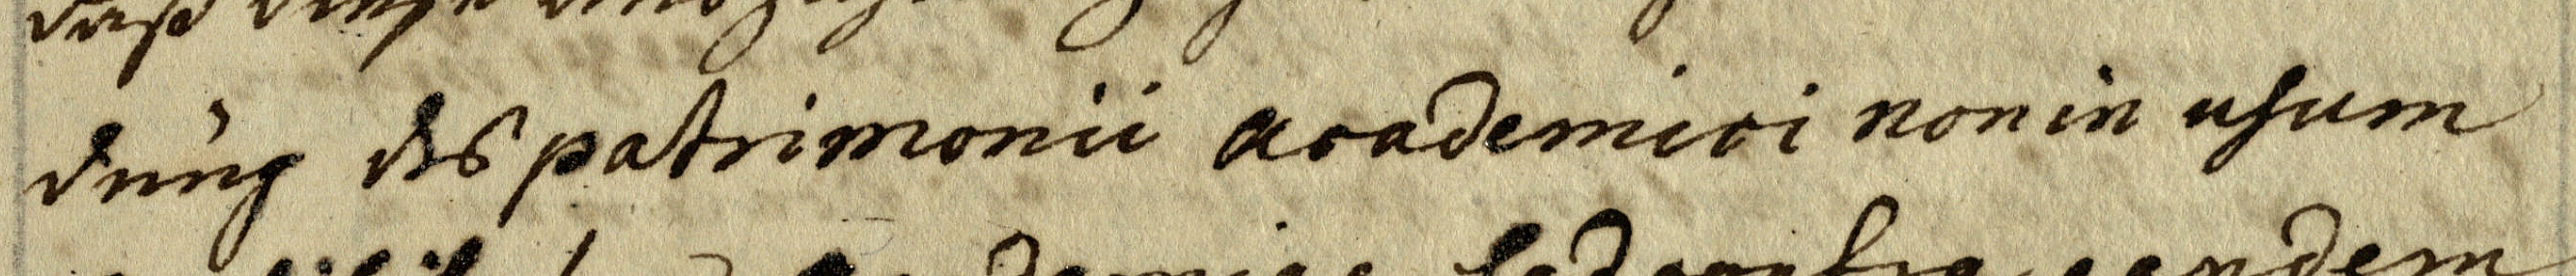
dung des patrimonii Academici non in usum
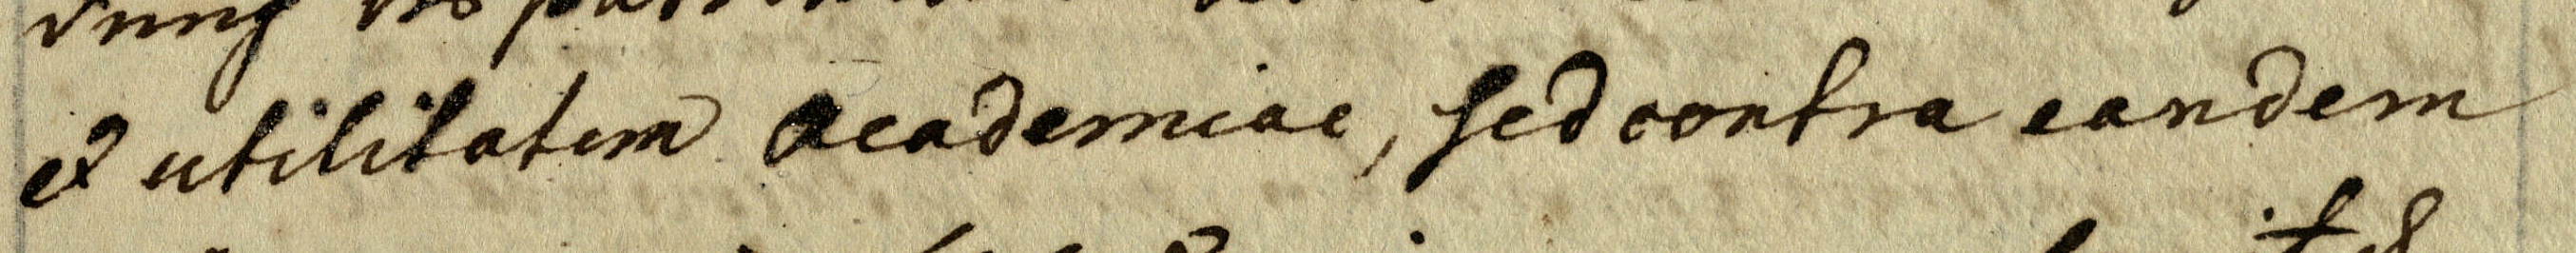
et utilitatem Academiae, sed contra eandem
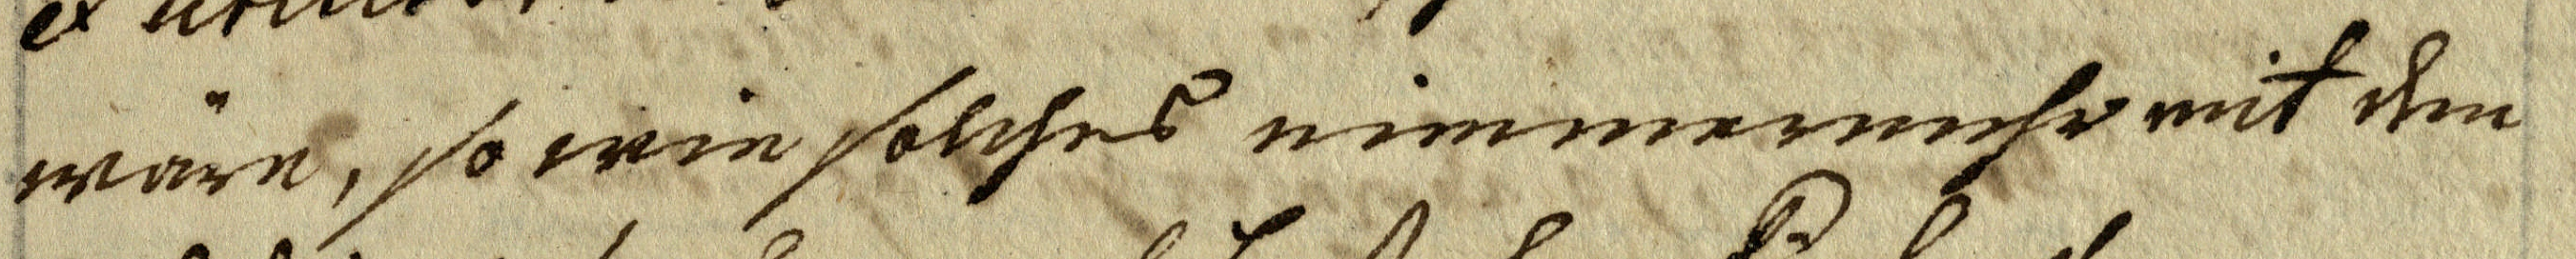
wäre, so wie solches nimmermehr mit dem
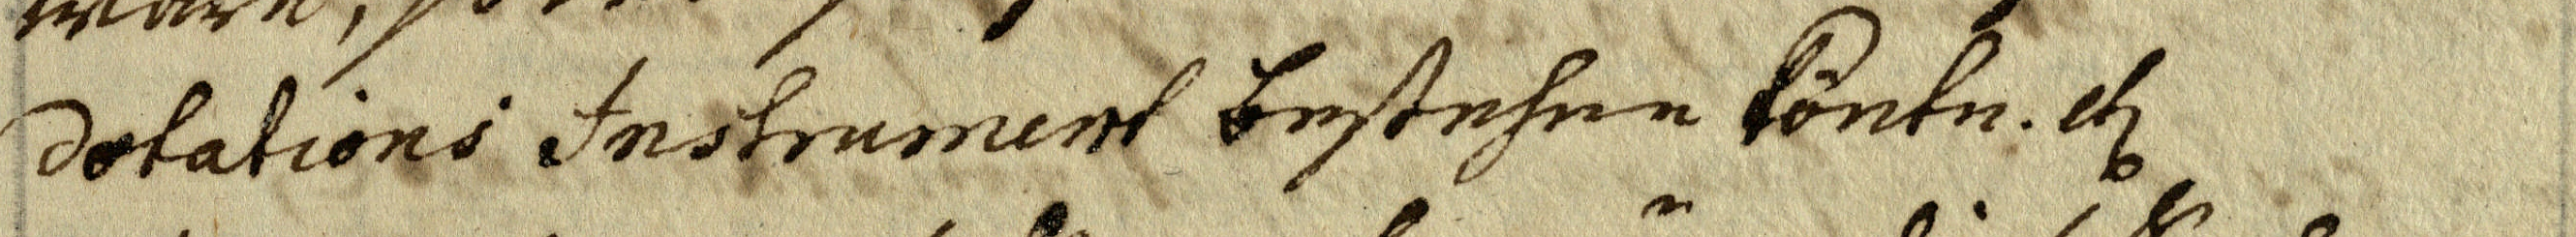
dotations Instrument bestehen könte. et.
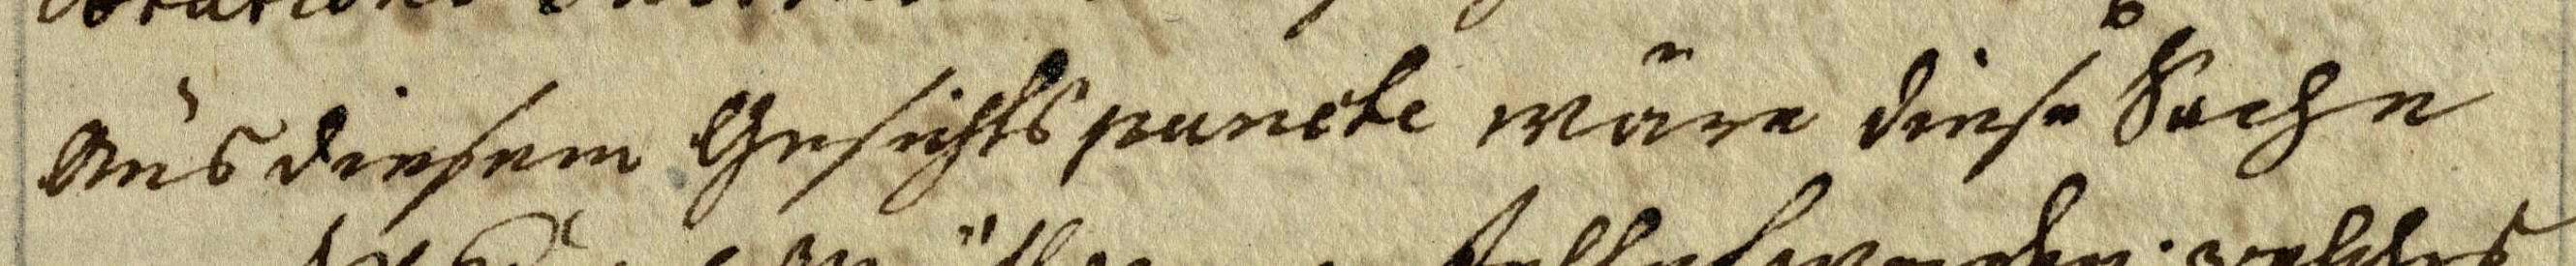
aus diesem Gesichtspuncte wäre diese Sache
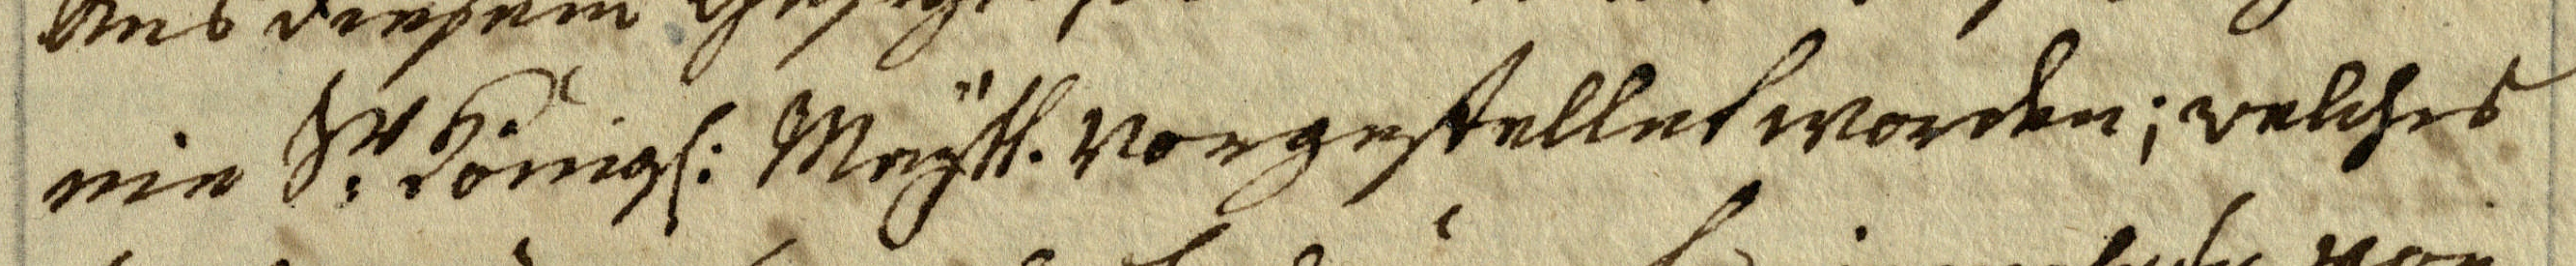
nie Sr Königl. Maÿtt. vorgestellet worden; welches
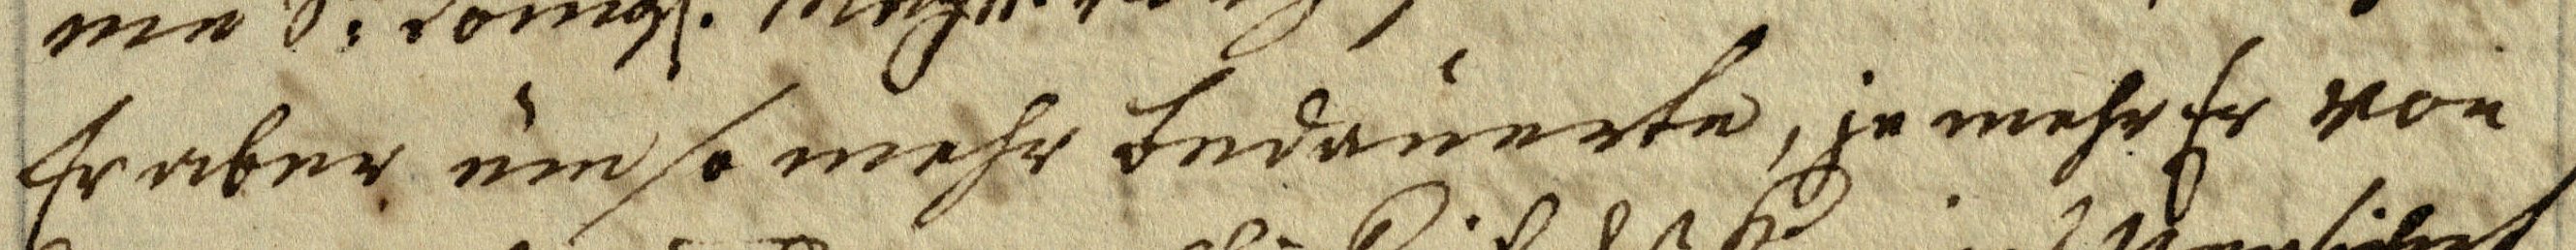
Er aber um so mehr bedauerte, je mehr Er von
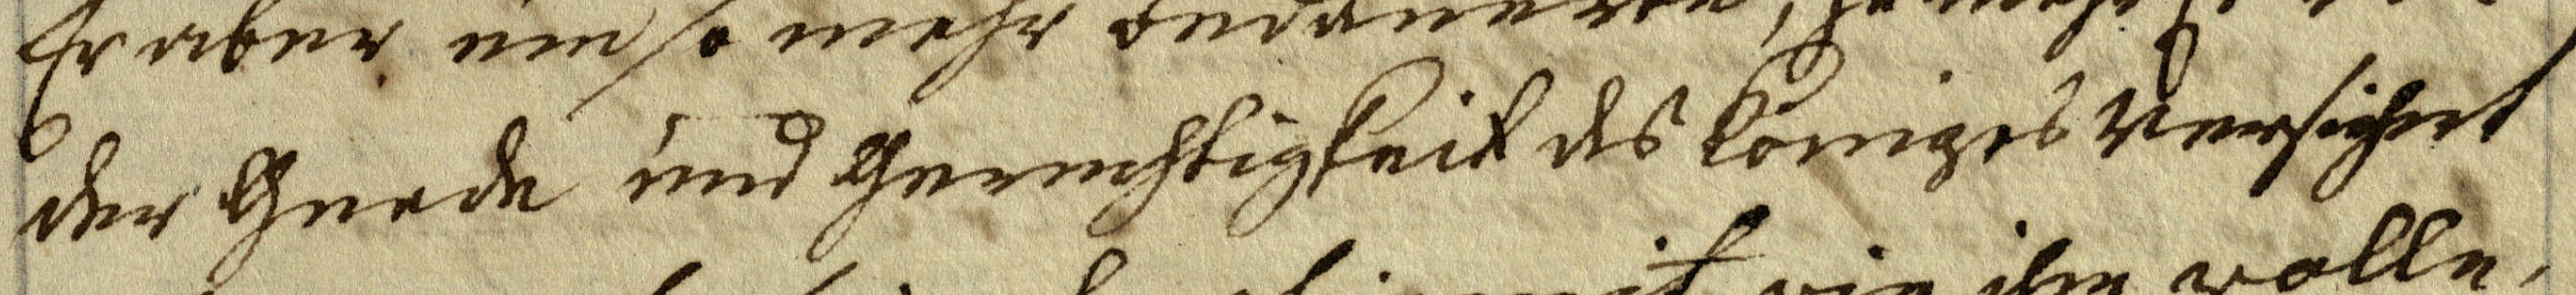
der Gnade und Gerechtigkeit des Königes versichert
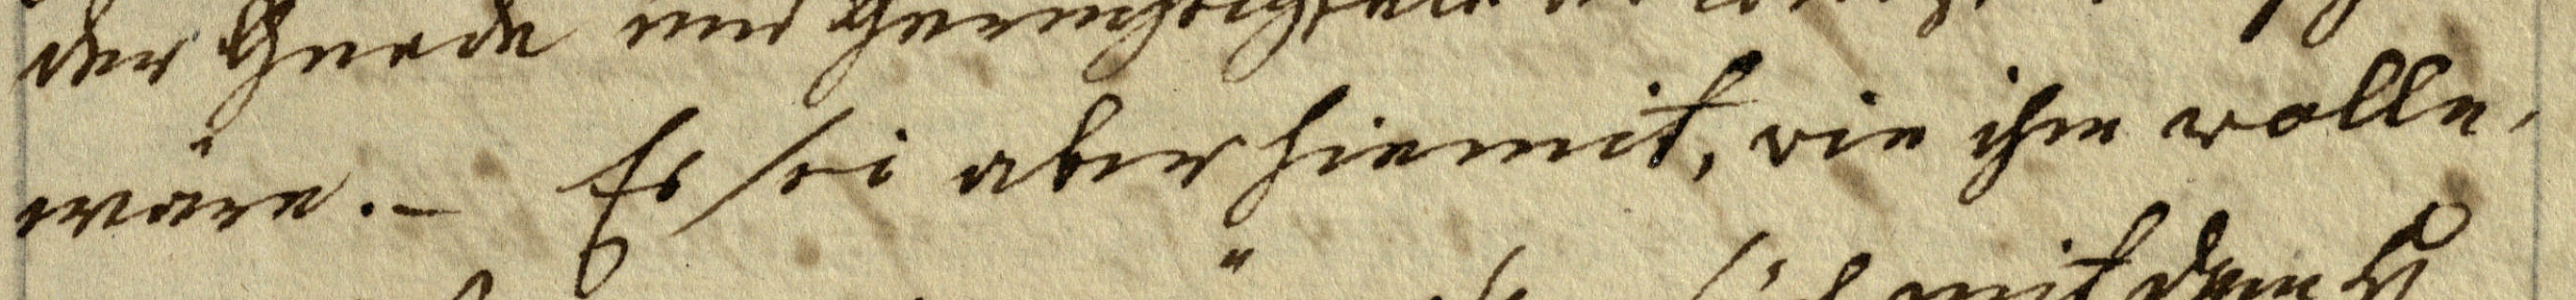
wäre. - Es sei aber hiemit, wie ihm wolle,
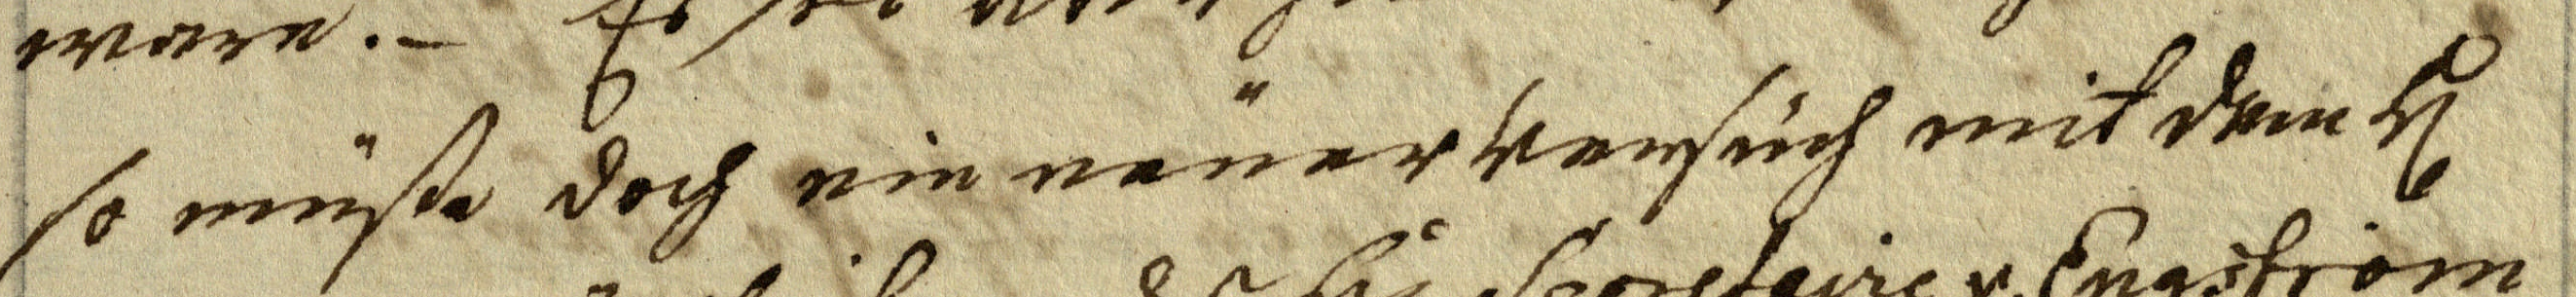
so müße doch ein neuer Versuch mit dem H.
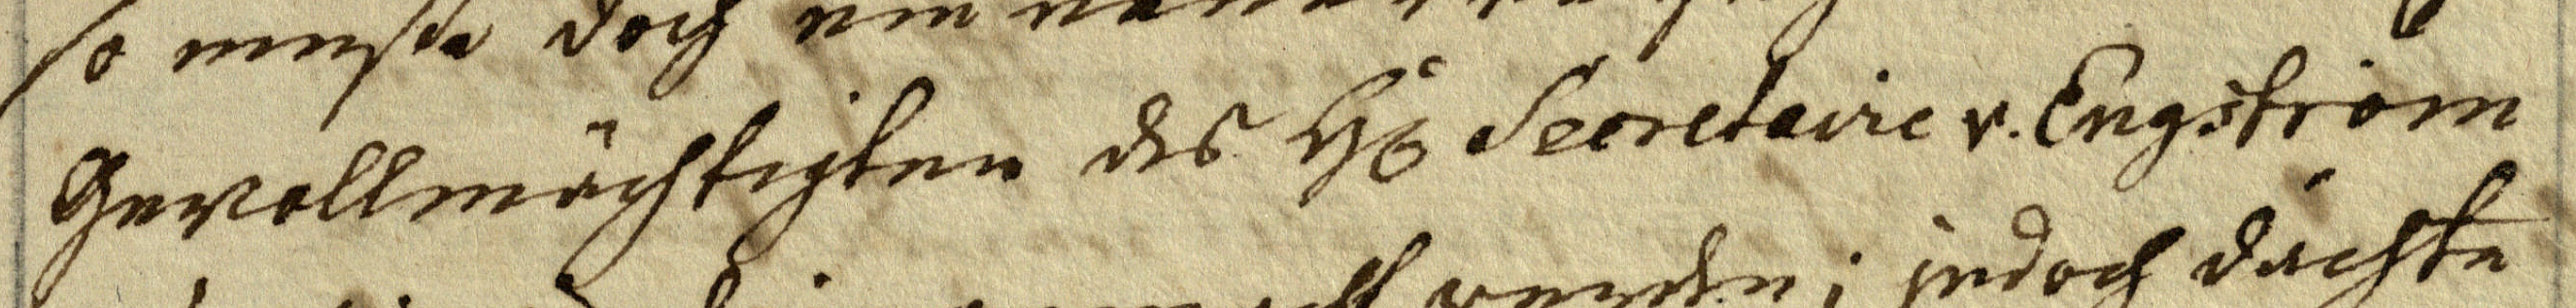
Gevollmächtigten des H. Secretaire v. Engström
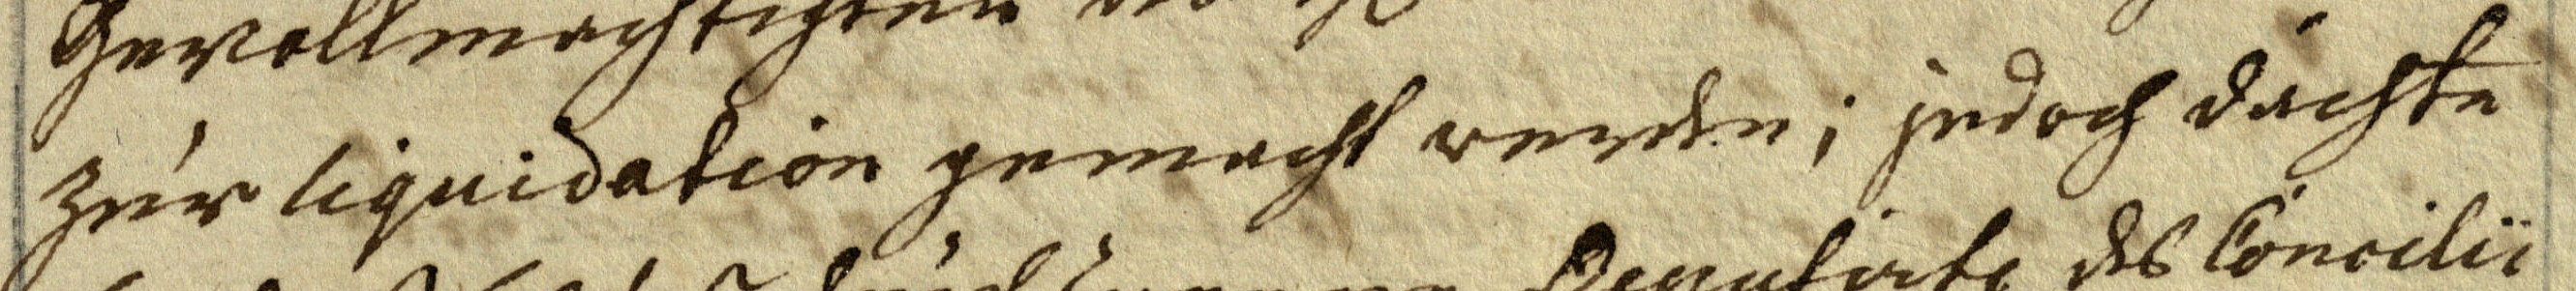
zur liquidation gemacht werden; jedoch dächte
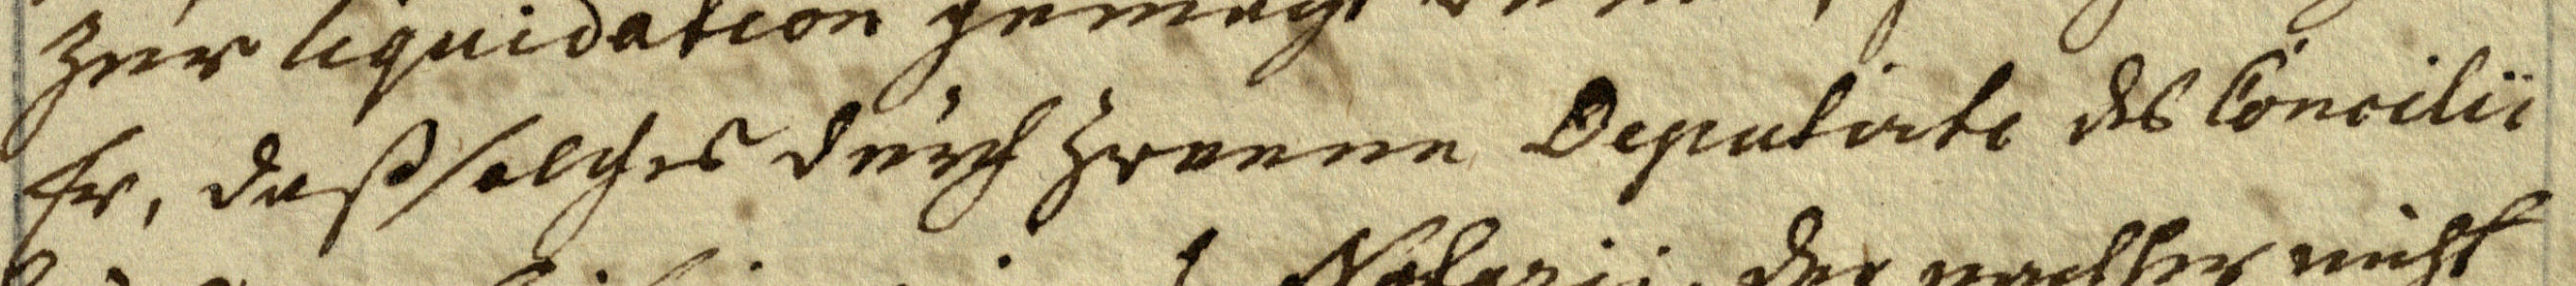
Er, daß solches durch zweene Deputirte des Concilii
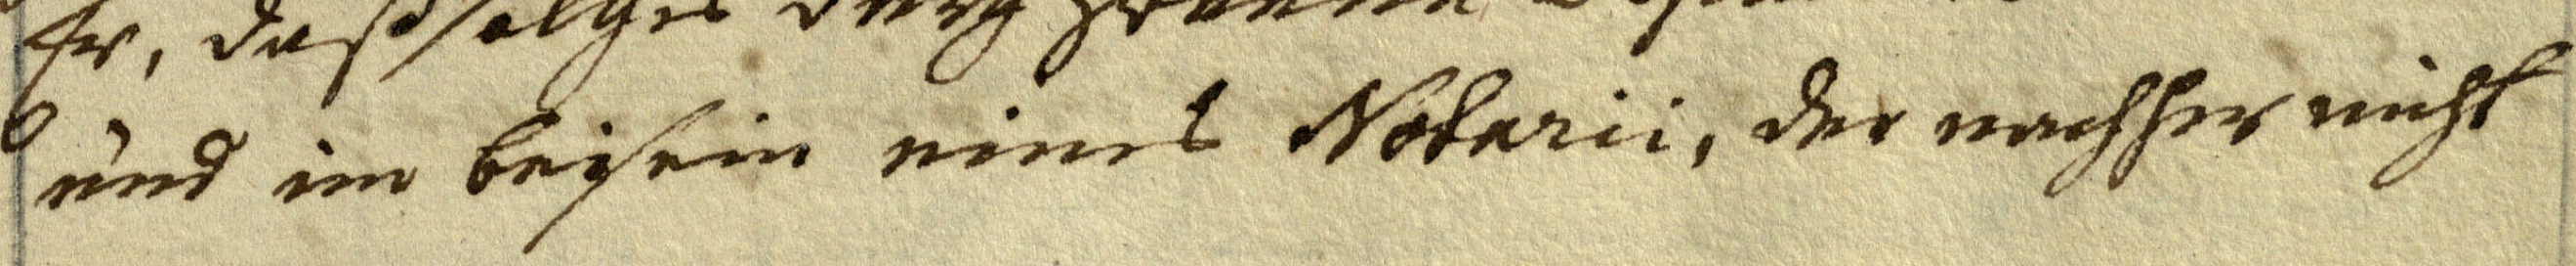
und im beisein eines Notarii, der nachher nicht
